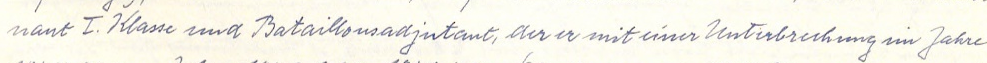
nant I. Klasse und Bataillonsadjutant, der er mit einer Unterbrechung im Jahre
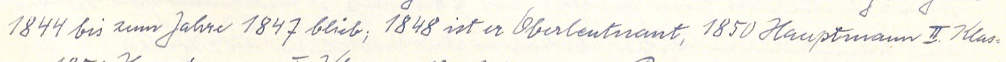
1844 bis zum Jahre 1847 blieb; 1848 ist er Oberleutnant, 1850 Hauptmann II. Klas-
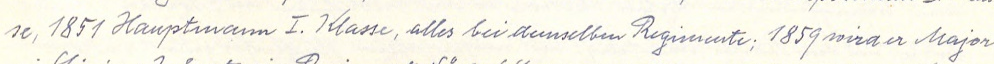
se, 1851 Hauptmann I. Klasse, alles bei demselben Regimente; 1859 wird er Major
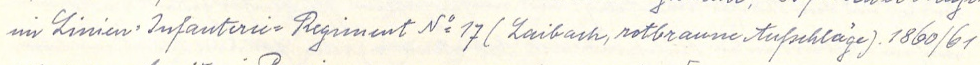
im Linien-Infanterie-Regiment Nr. 17 (Laibach, rotbraune Aufschläg). 1860/61
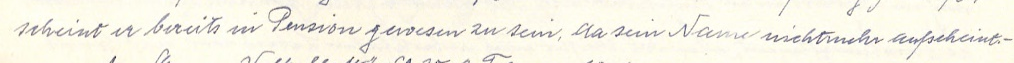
scheint er bereits in Pension gewesen zu sein, da sein Name nicht mehr aufscheint. -
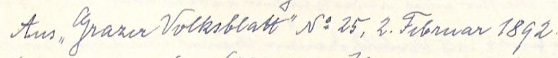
Aus "Grazer Volksblatt" Nr. 25, 2. Februar 1892:
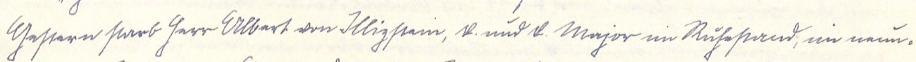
Gestern starb Herr Albert von Illizstein, k. und k. Major im Ruhestand, im neun-
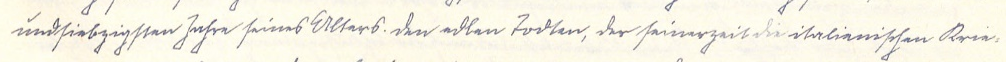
undsiebzigsten Jahre seines Alters. Den edlen Todten, der seinerzeit die italienischen Krie-
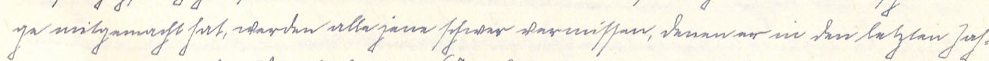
ge mitgemacht hat, werden alle jene schwer vermissen, denen er in den letzten Jah-
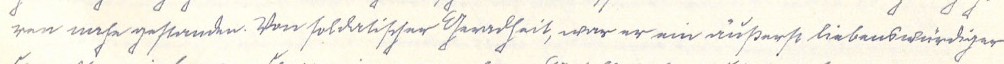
ren nahe gestanden. Von soldatischer Geradheit, war er ein äußerst liebenswürdiger
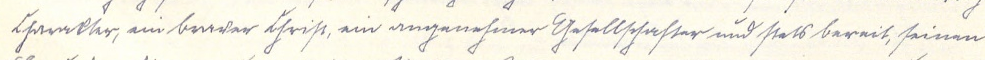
Charakter, ein braver Christ, ein angenehmer Gesellschafter und stets bereit, seinen
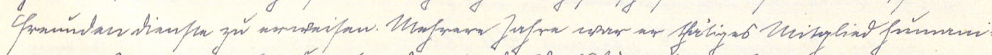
Freunden Dienste zu erweisen. Mehrere Jahre war er thätiges Mitglied humani-
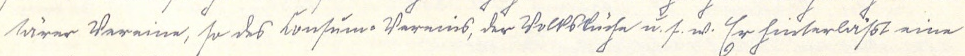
tärer Vereine, so des Consum-Vereins, der Volksbühne u. f. w. Er hinterlässt eine
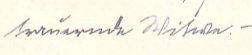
traurernde Witwe. -
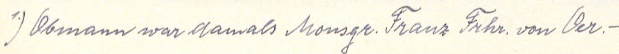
1.) Obmann war damals Monsgr. Franz Frhr. von Oer. -
